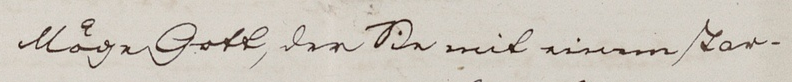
Möge Gott, der Sie mit einem star-
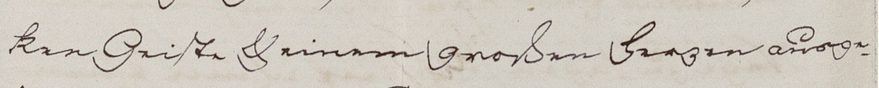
ken Geiste & einem großen Herzen ausge-
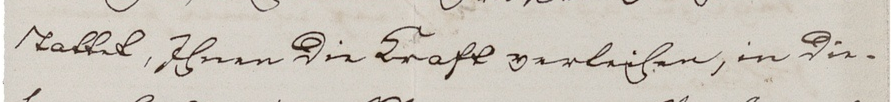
stattet, Ihnen die Kraft verleihen, in die-
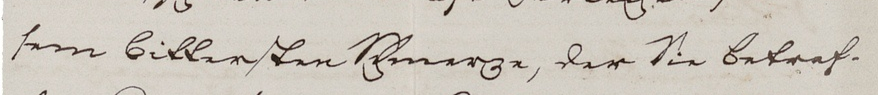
sem bittersten Schmerze, der Sie betref-
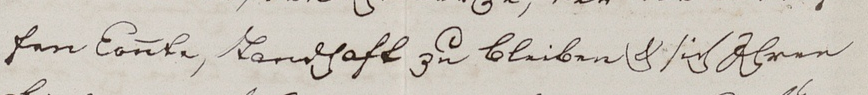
fen konnte, standhaft zu bleiben & sich Ihren
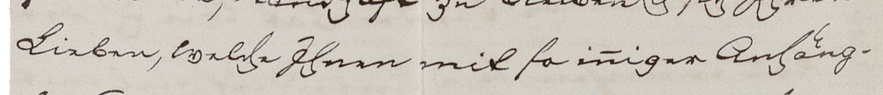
Lieben, welche Ihnen mit so inniger Anhäng-
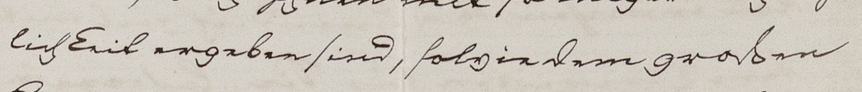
lichkeit ergeben sind, sowie dem großen
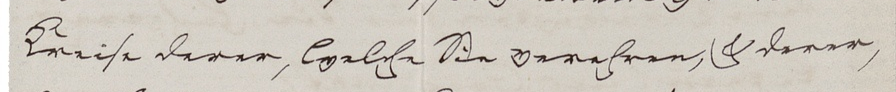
Kreise derer, welche Sie verehren und derer,
